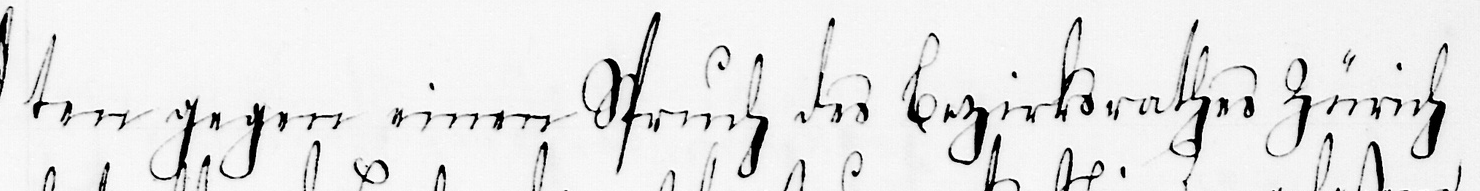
ten gegen einen Spruch des Bezirksrathes Zürich
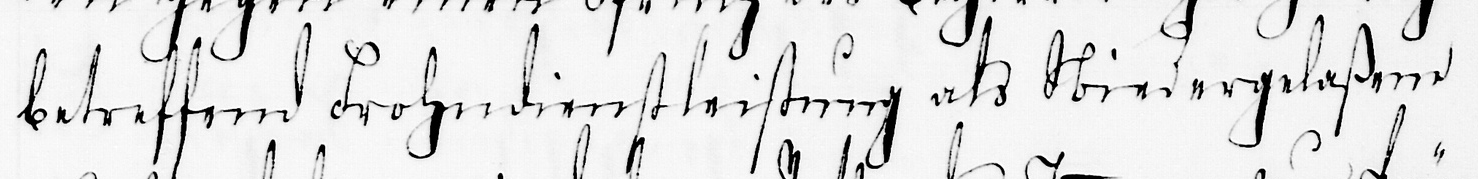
betreffend Frohndienstleistung als Niedergelaßene
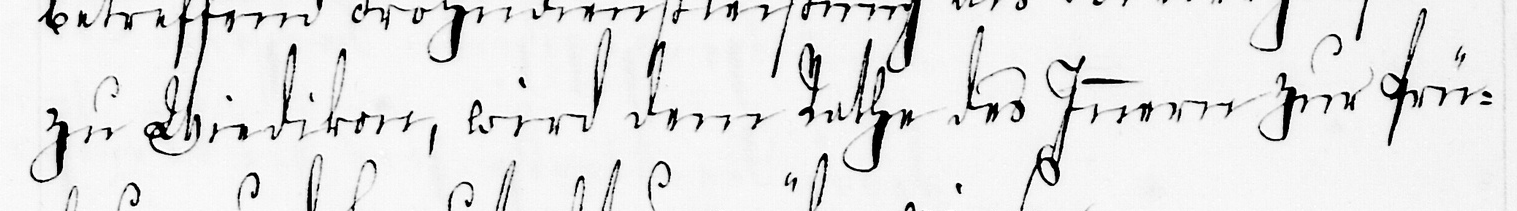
zu Wiedikon, wird dem Rathe des Innern zur Prü¬
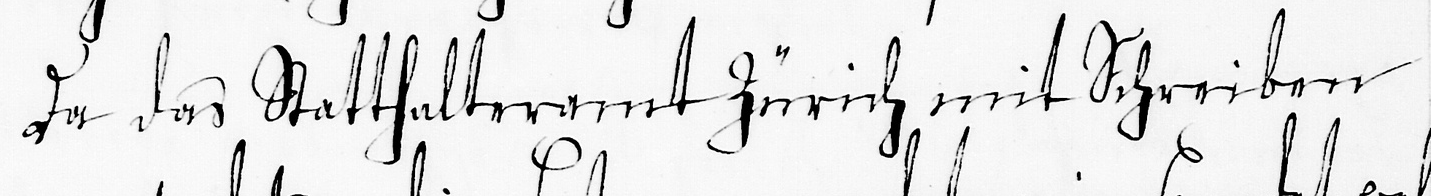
Da das Statthalteramt Zürich mit Schreiben
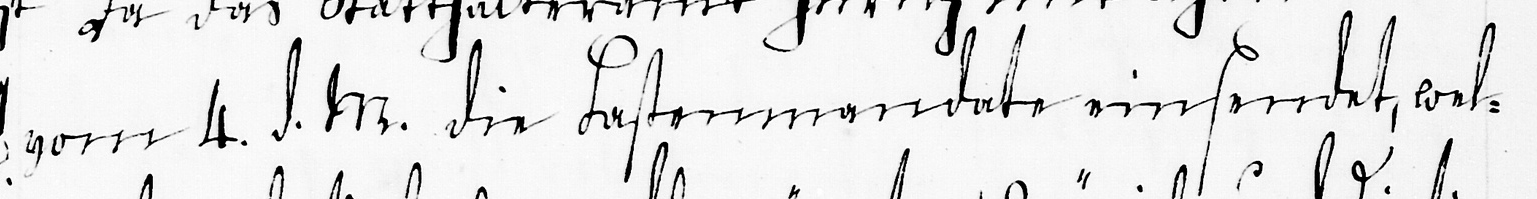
vom 4. d. M. die Fastenmandate einsendet, wel¬
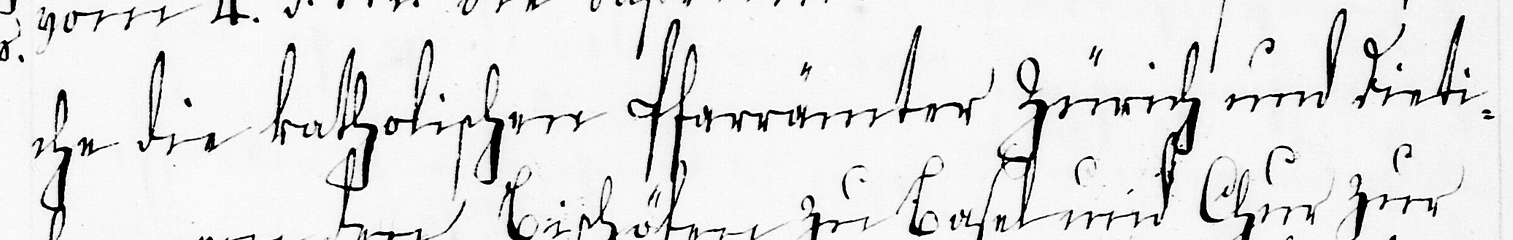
che die katholischen Pfarrämter Zürich und Dieti¬
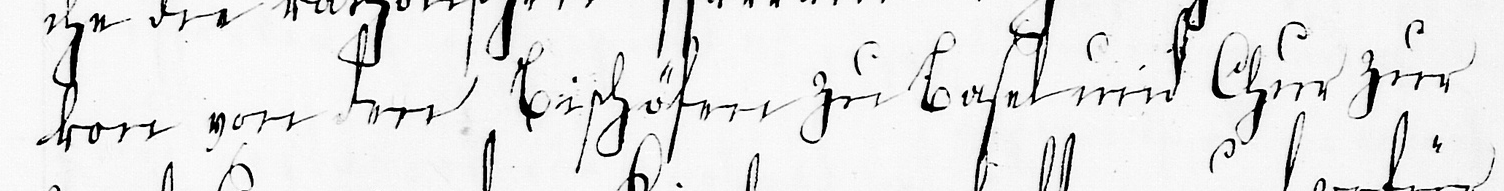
kon von den Bischöfen zu Basel und Chur zur
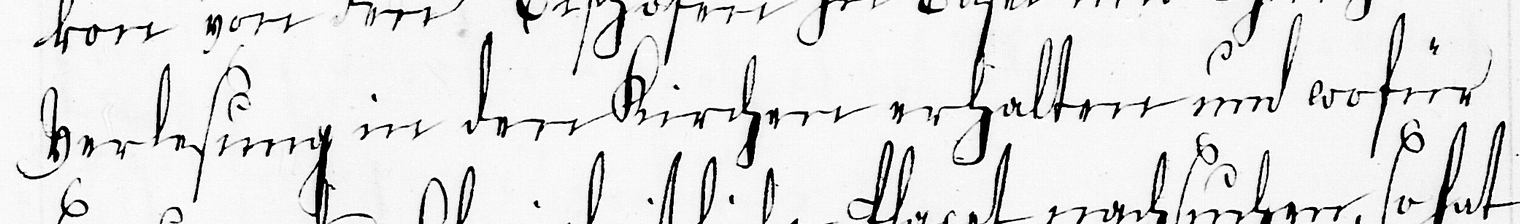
Verlesung in den Kirchen erhalten und wofür
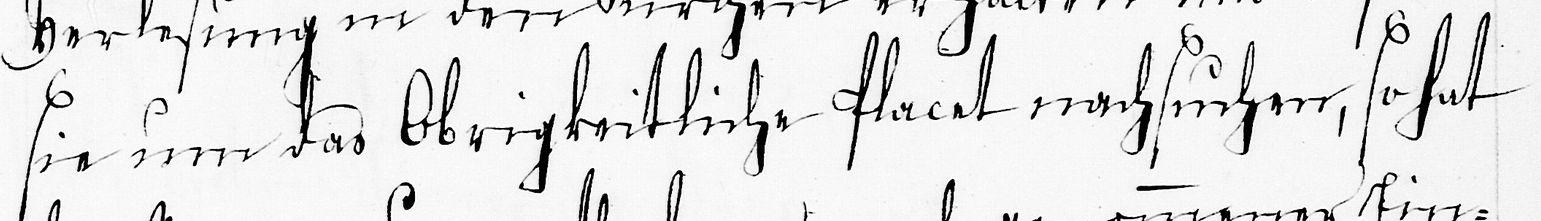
sie um das Obrigkeitliche Placet nachsuchen, so hat
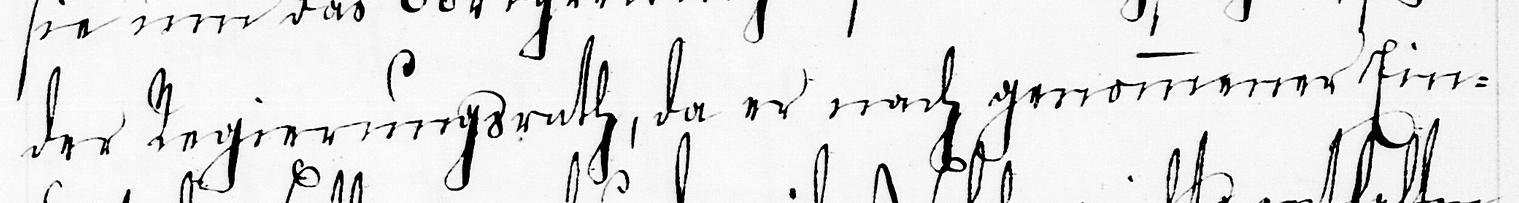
der Regierungsrath, da er nach genommener Ein¬
